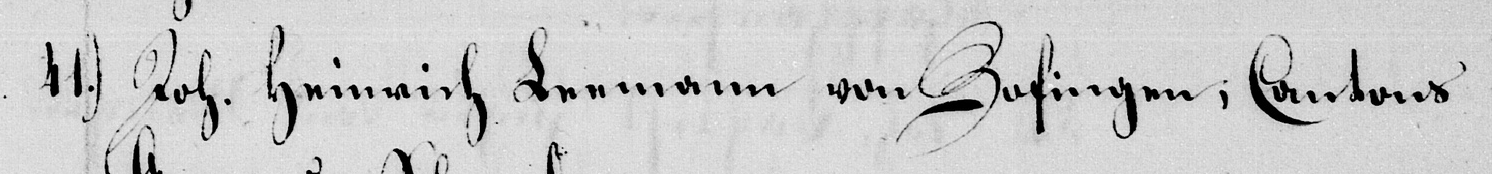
41.) Joh. Heinrich Leemann von Zofingen, Cantons
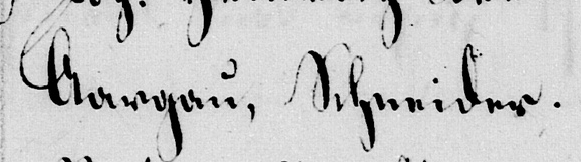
Aargau, Schneider.
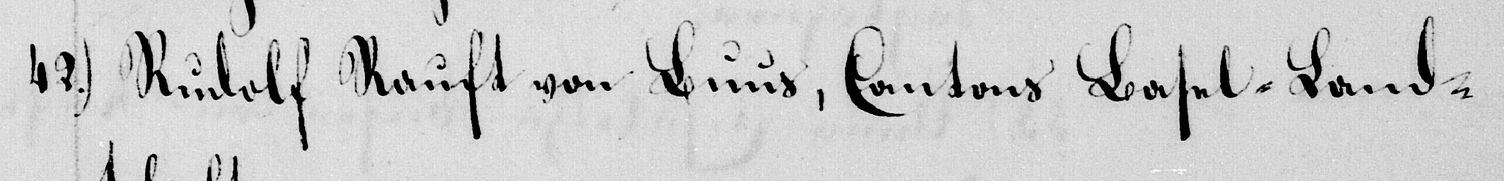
42.) Rudolf Kauft von Buus, Cantons Basel-Land¬
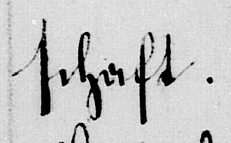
schaft.
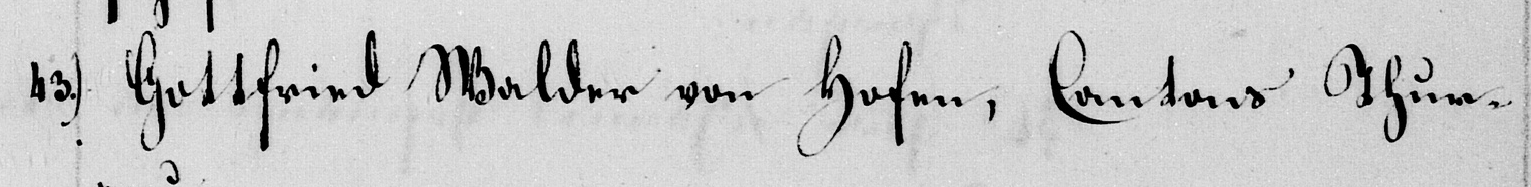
43.) Gottfried Walder von Hofen, Cantons Thur¬
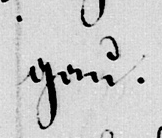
gau.
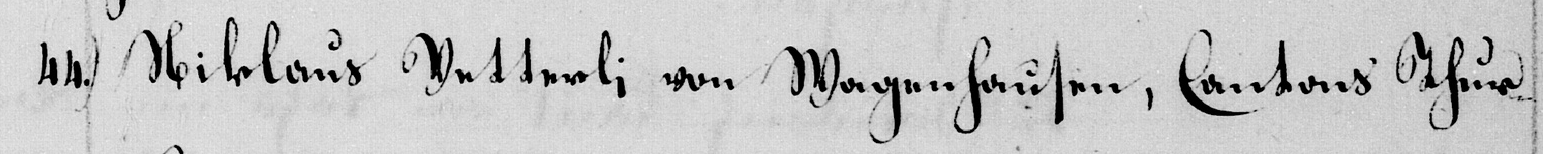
44.) Niklaus Vetterli von Wagenhausen, Cantons Thur¬
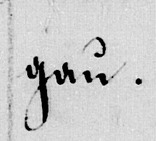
gau.
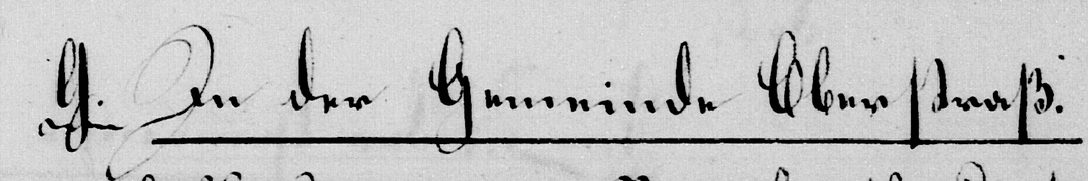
G. In der Gemeinde Oberstraß.
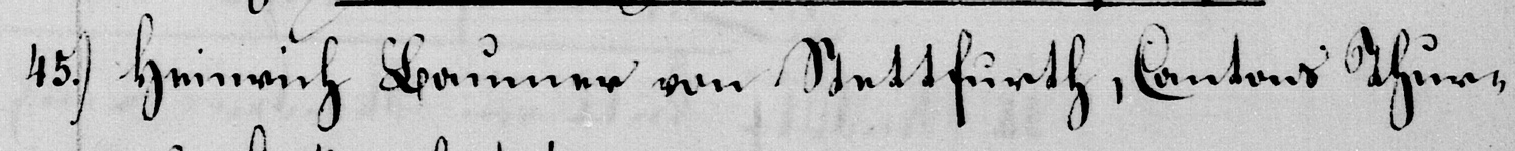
45.) Heinrich Baumer von Stettfurth, Cantons Thur¬
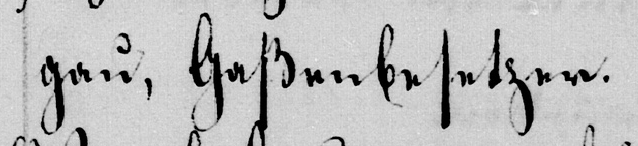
gau, Gaßenbesetzer.
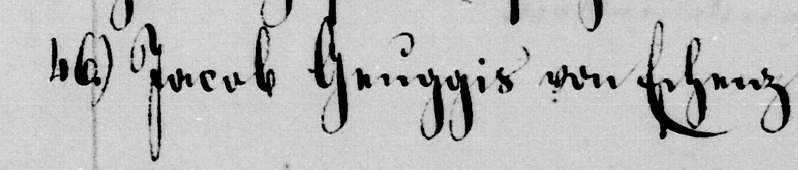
46.) Jacob Gruggis von Eschenz
